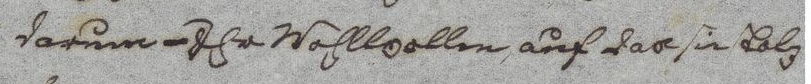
darum – Ihr Wohlwollen, auf das sie stolz
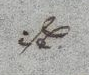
ist.
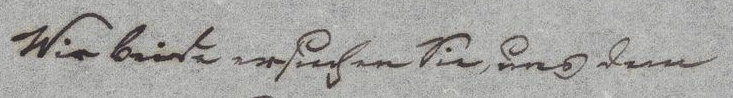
Wir beide ersuchen Sie, uns dem
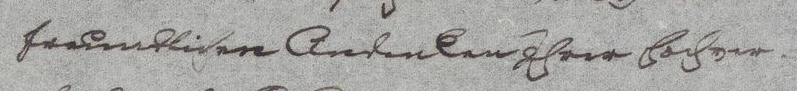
freundlichen Andenken Ihrer hochver-
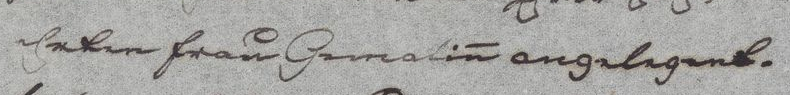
ehrten Frau Gemalinn angelegent-
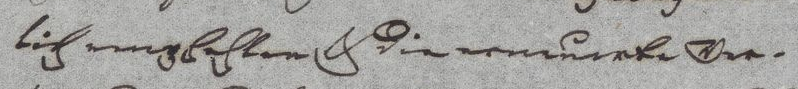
lich emphehlen & die erneuerte Ver-
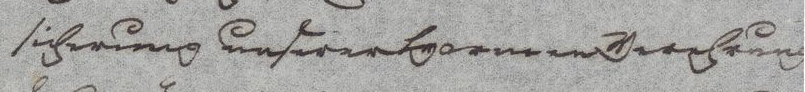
sicherung unserer warmen Verehrung
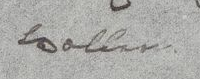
wollen.
